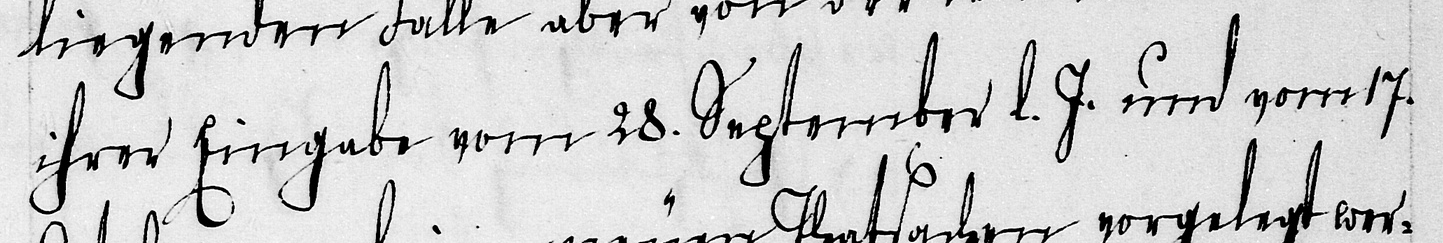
ihrer Eingabe vom 28. September d. J. und vom 17.
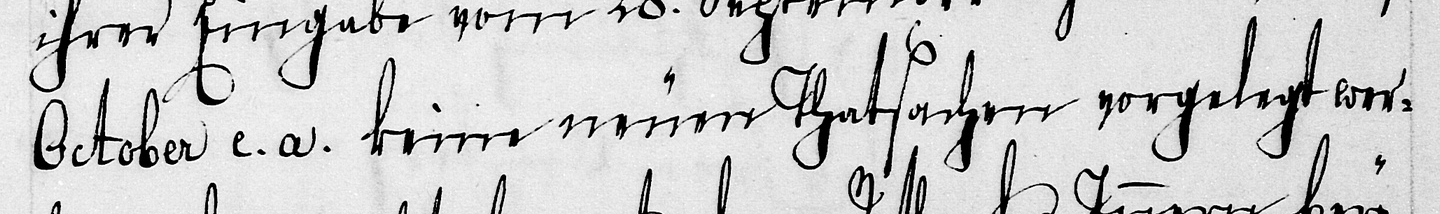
October c. a. keine neuen Thatsachen vorgelegt wer¬
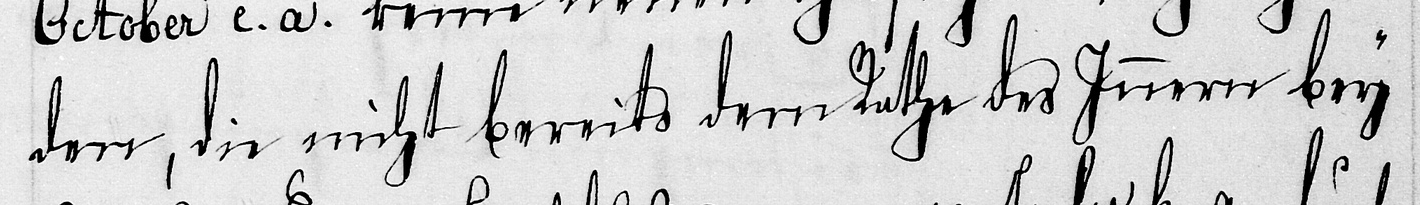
den, die nicht bereits dem Rathe des Innern bey
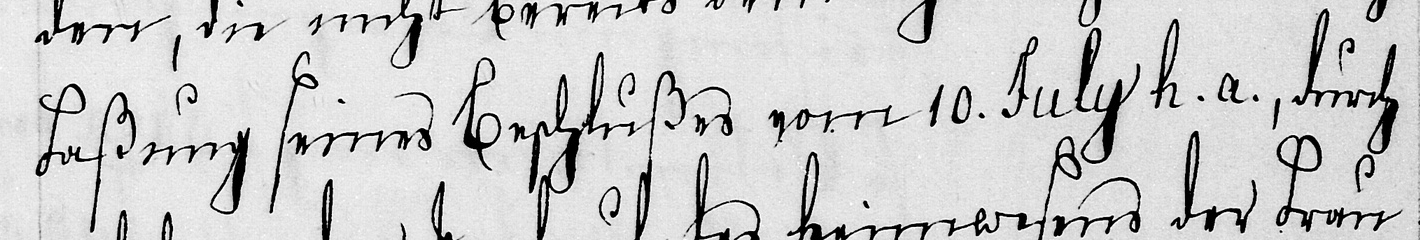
Faßung seines Beschlußes vom 10. July h. a., durch
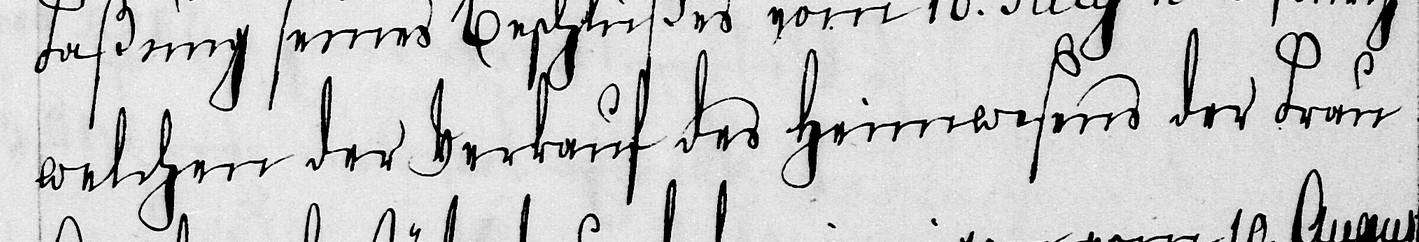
welchen der Verkauf des Heimwesens der Frau
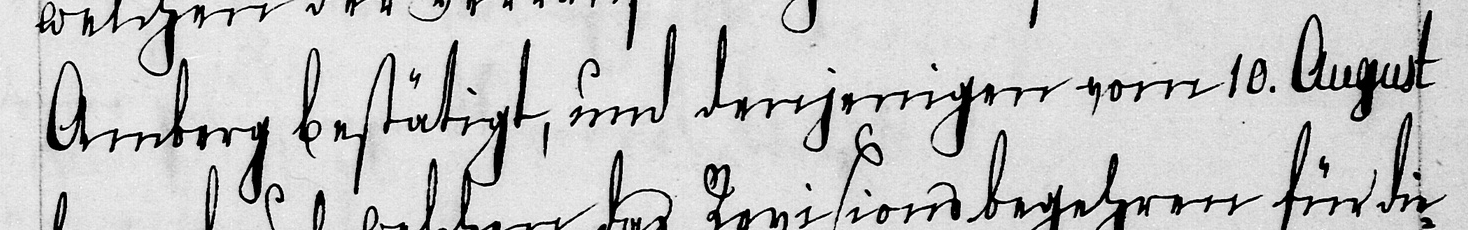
Amberg bestätigt, und denjenigen vom 10. August
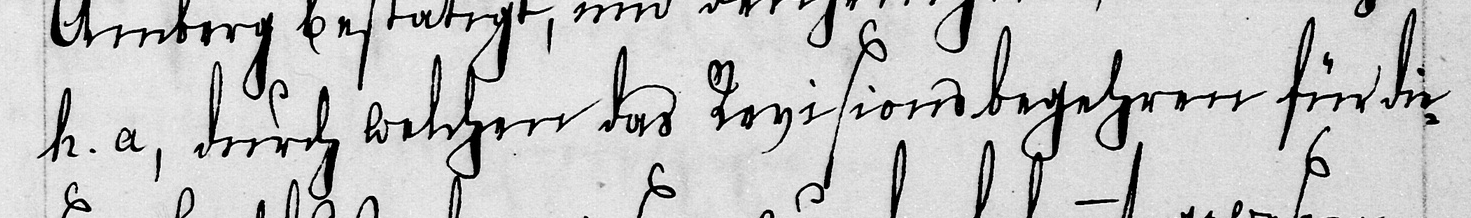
h. a, durch welchen das Revisionsbegehren für die¬
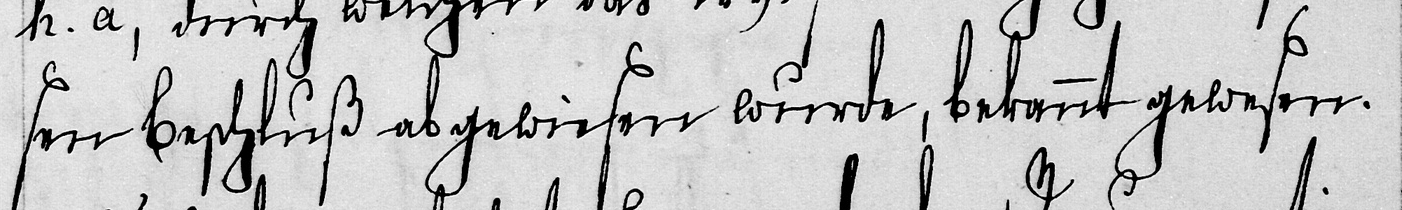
sen Beschluß abgewiesen wurde, bekannt gewesen.
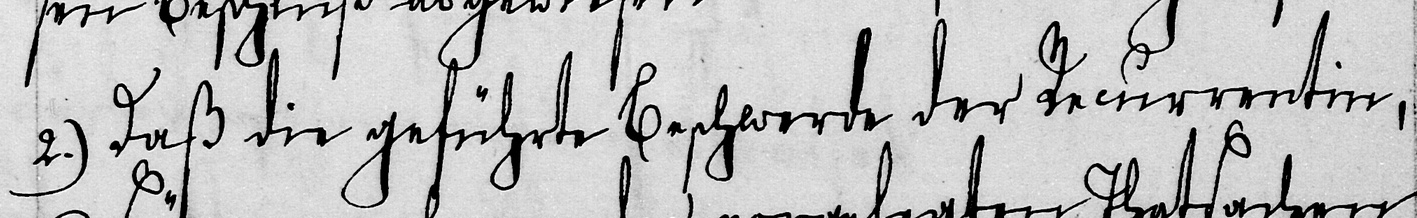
2.) Daß die geführte Beschwerde der Recurrentin,
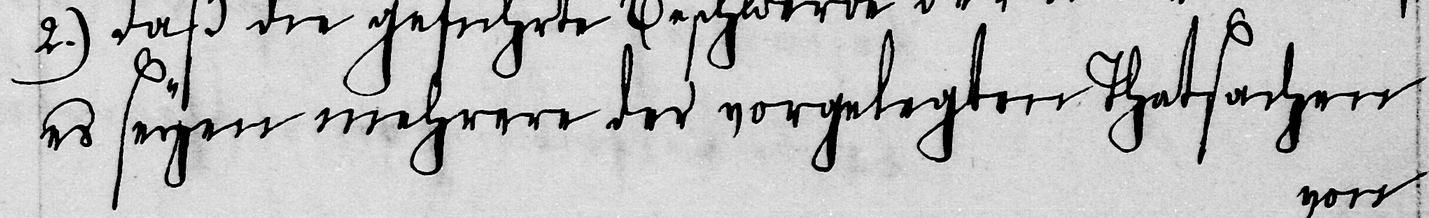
es seyen mehrere der vorgelegten Thatsachen
